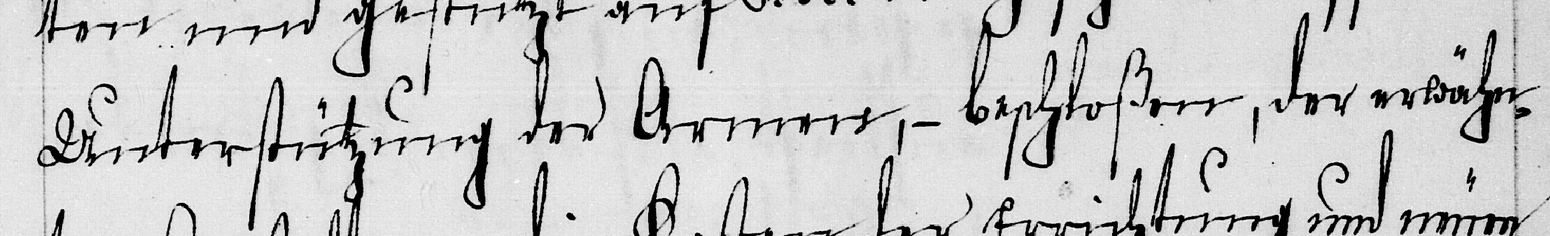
Unterstützung der Armen, – beschloßen, der erwähn¬
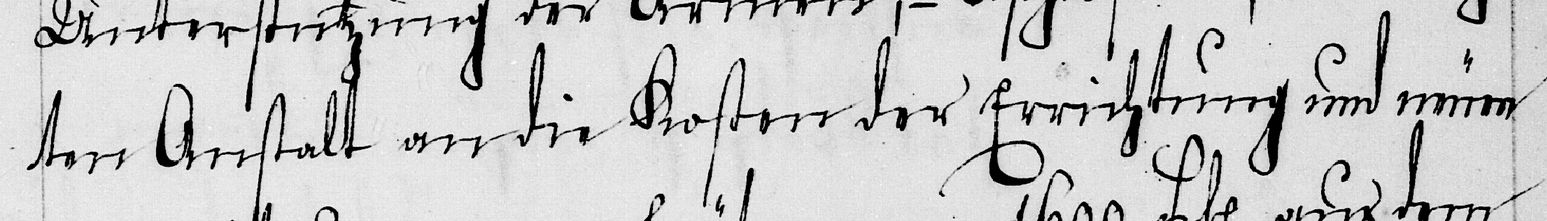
ten Anstalt an die Kosten der Errichtung und neuen
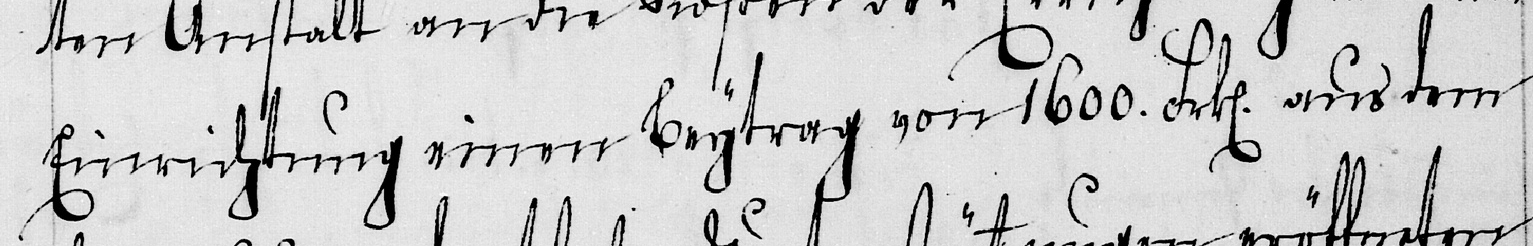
Einrichtung einen Beytrag von 1600. Frk[en] aus dem
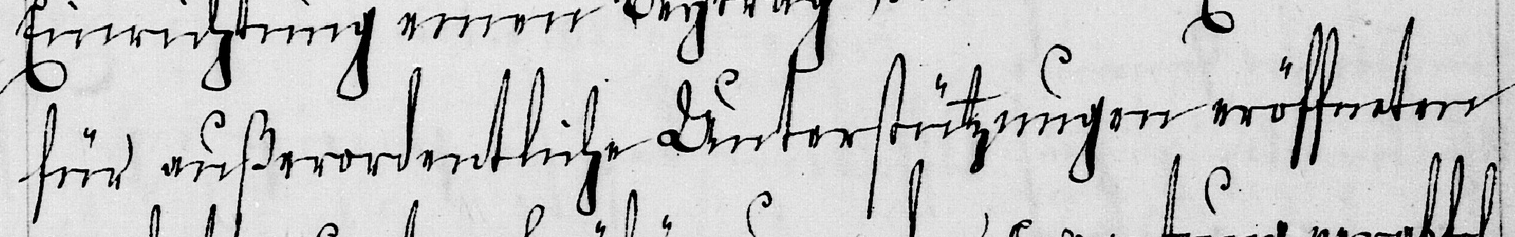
für außerordentliche Unterstützungen eröffneten
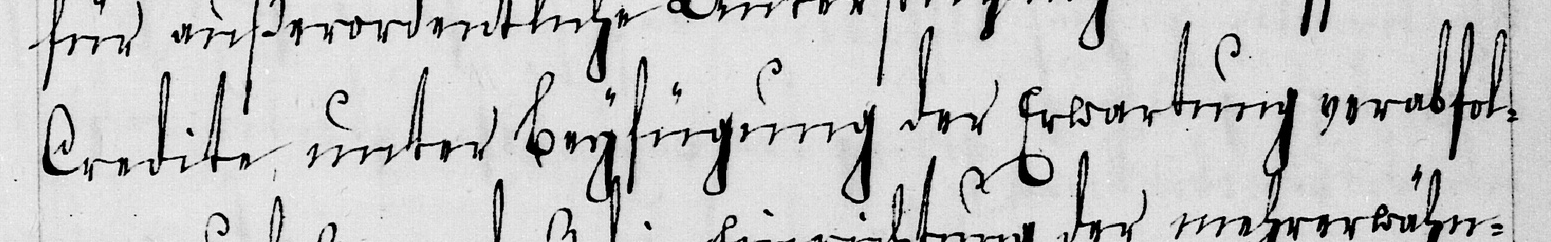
Credite, unter Beyfügung der Erwartung verabfol¬
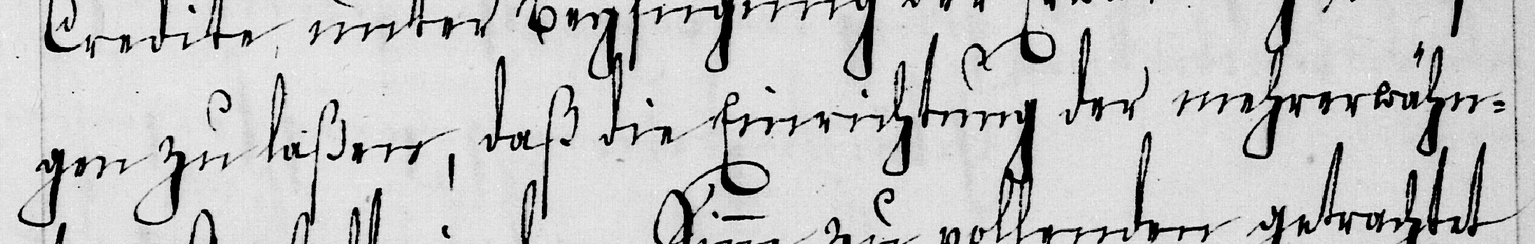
gen zu laßen, daß die Einrichtung der mehrerwähn¬
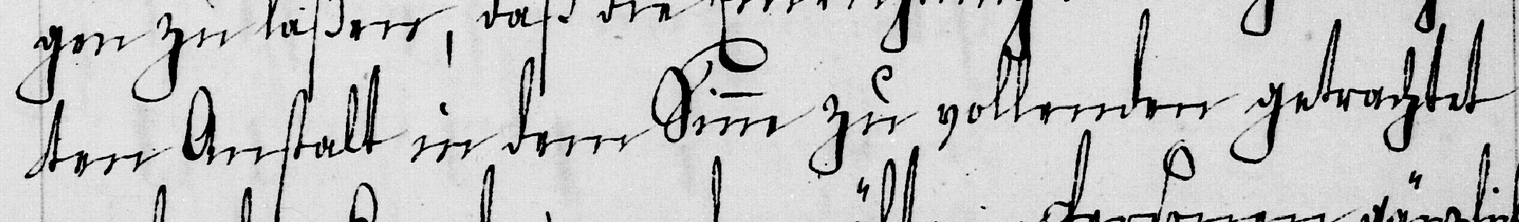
ten Anstalt in dem Sinne zu vollenden getrachtet
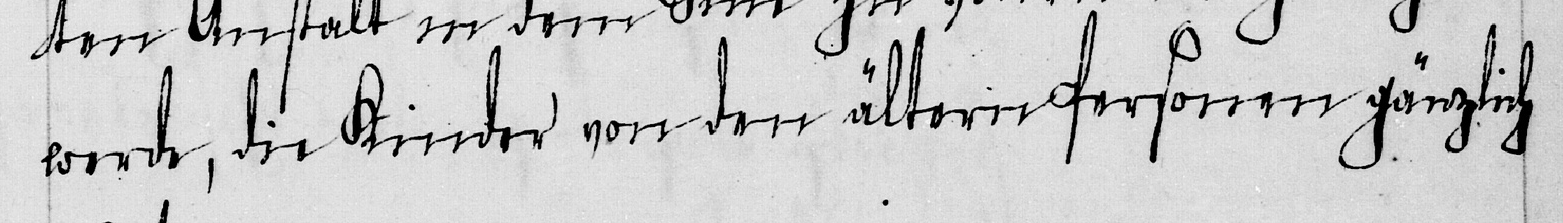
werde, die Kinder von den ältern Personen gänzlich
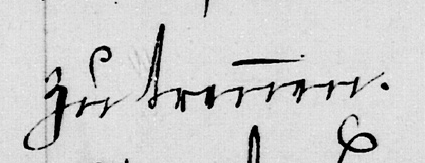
zu trennen.
